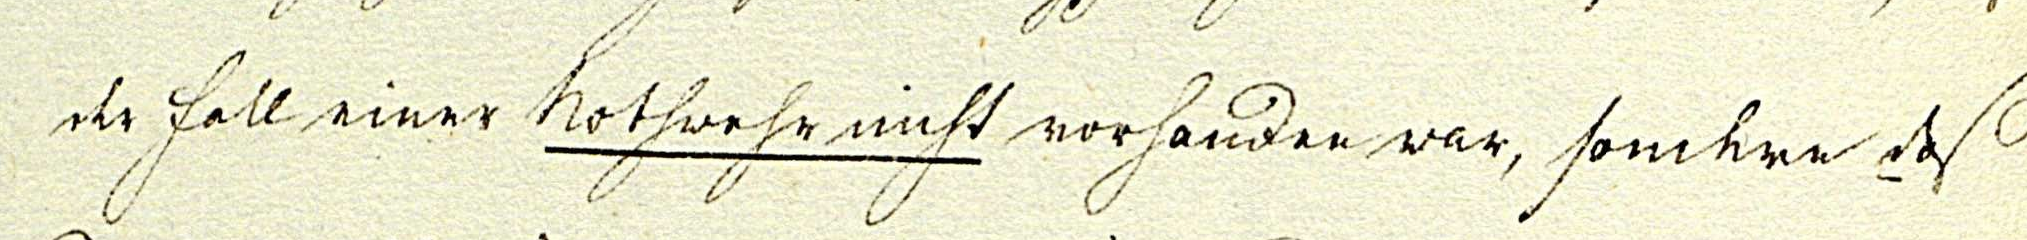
der Fall einer Nothwehr nicht vorhanden war, sonder daß
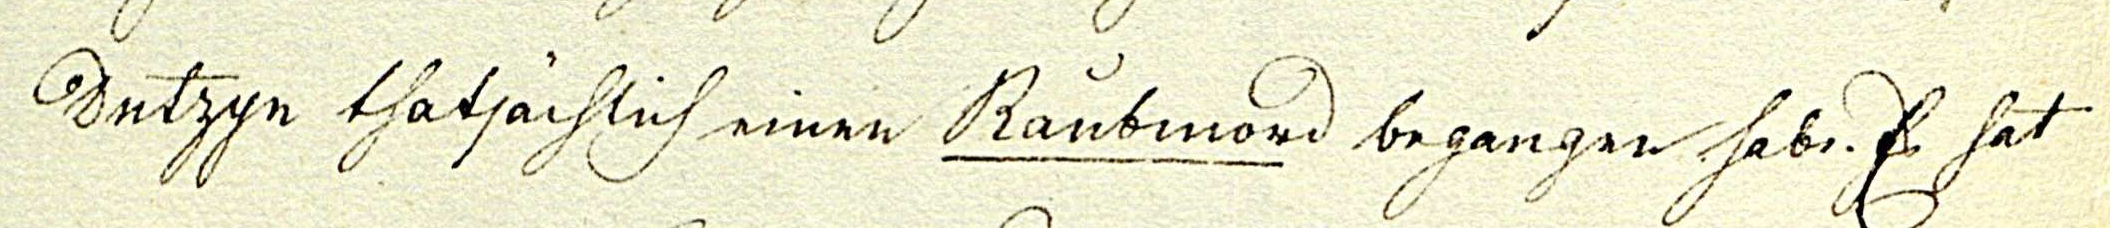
Dutzyn thatsächlich einen Raubmord begangen habe. Es hat
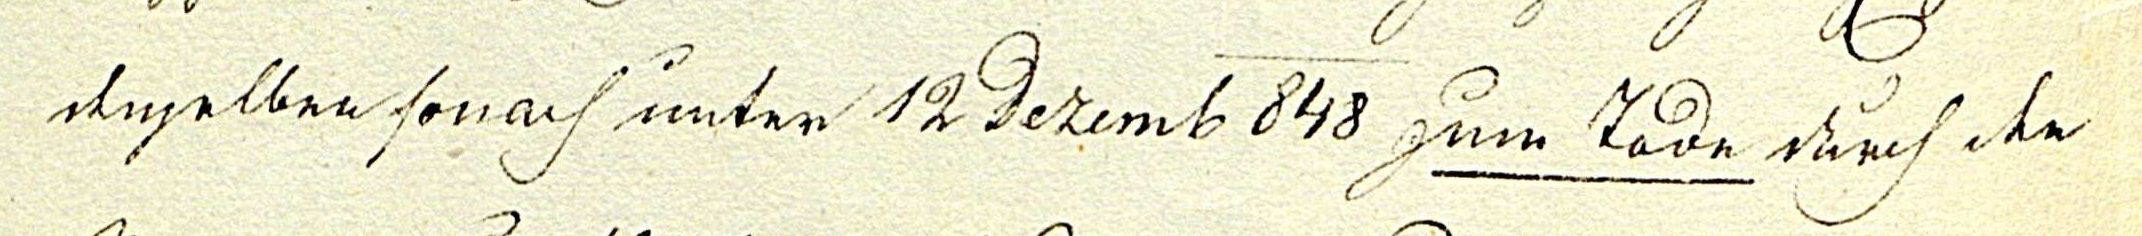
denselben sonach unter 12 Dezemb. 848 zum Tode durch den
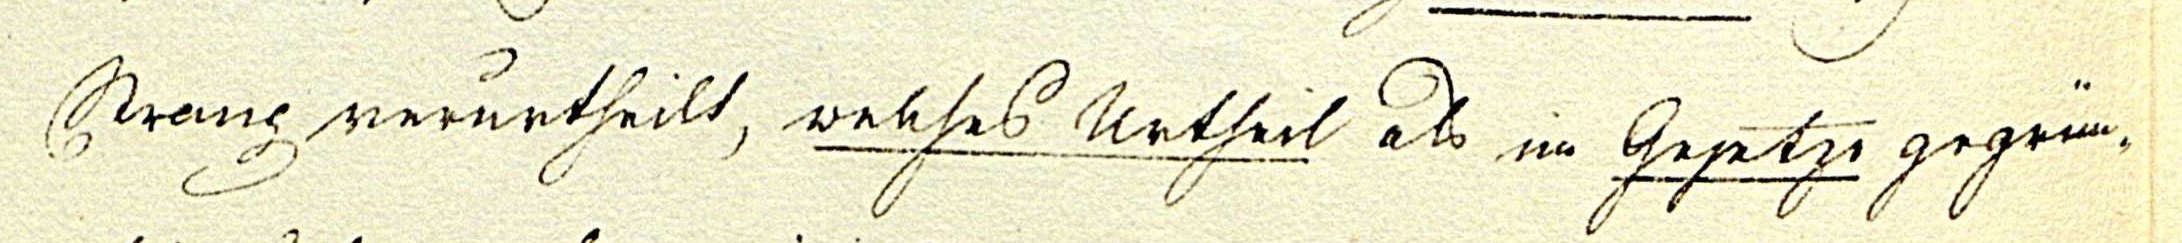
Strang verurtheilt, welches Urtheil als im Gesetze gegrün¬
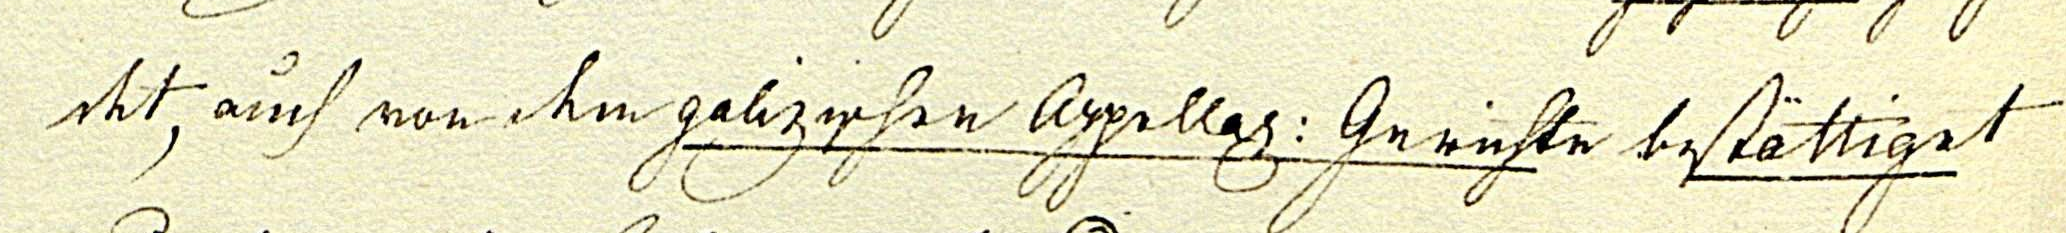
det, auch von dem galizischen Appellat. Gerichte bestätiget
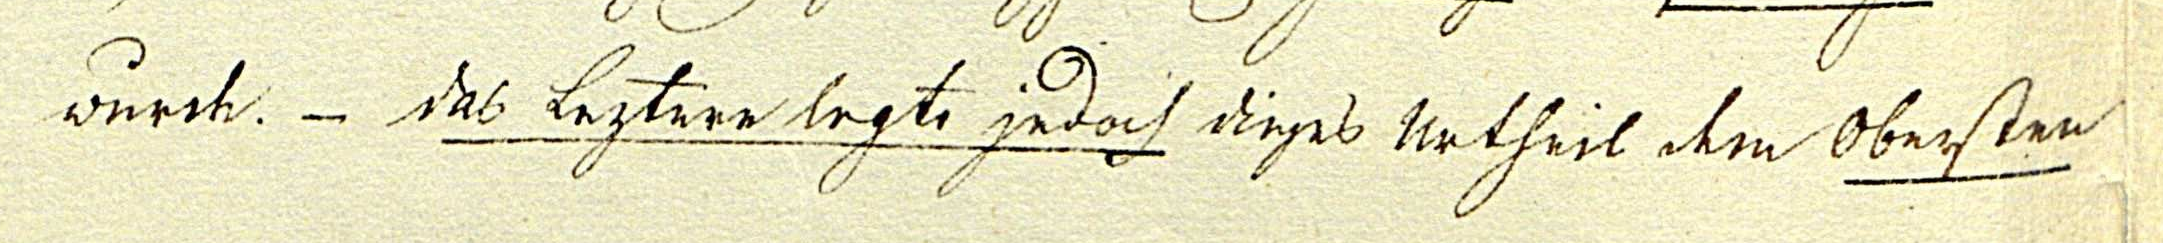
wurde. Das letztere legte jedoch dieses Urtheil dem Obersten
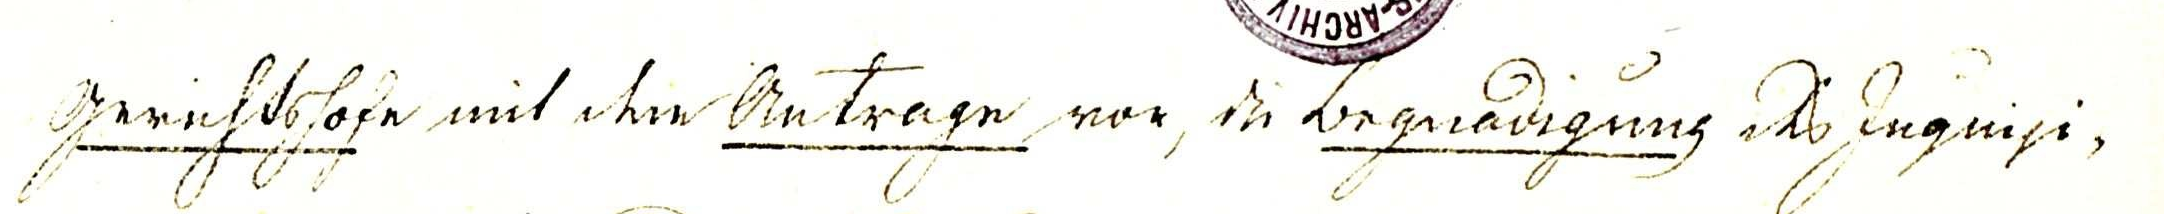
Gerichtshofe mit dem Antrage war, die Begnadigung des Inquisi¬
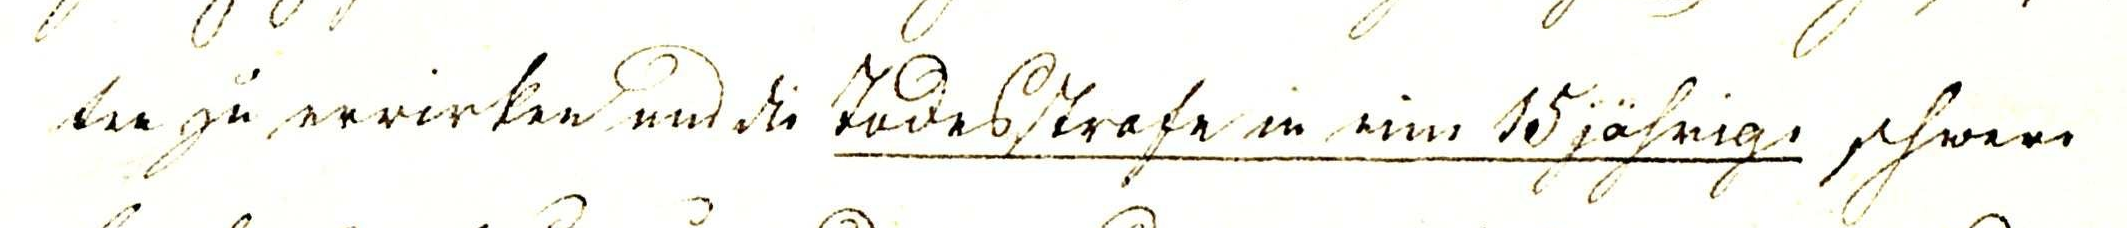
ten zu erwirkten und die Todesstrafe in ein 15jährige schwere
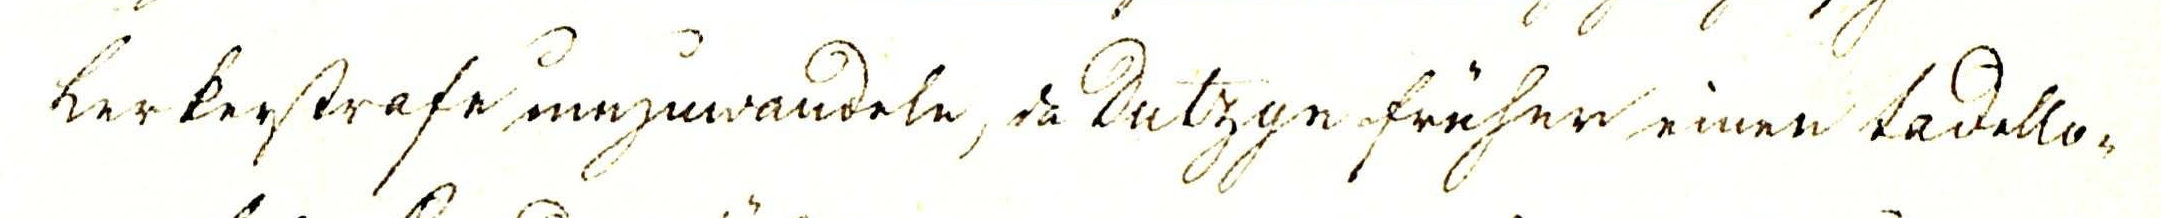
Kerkerstrafe umzuwandeln, da Dutzyn früher einen tadello¬
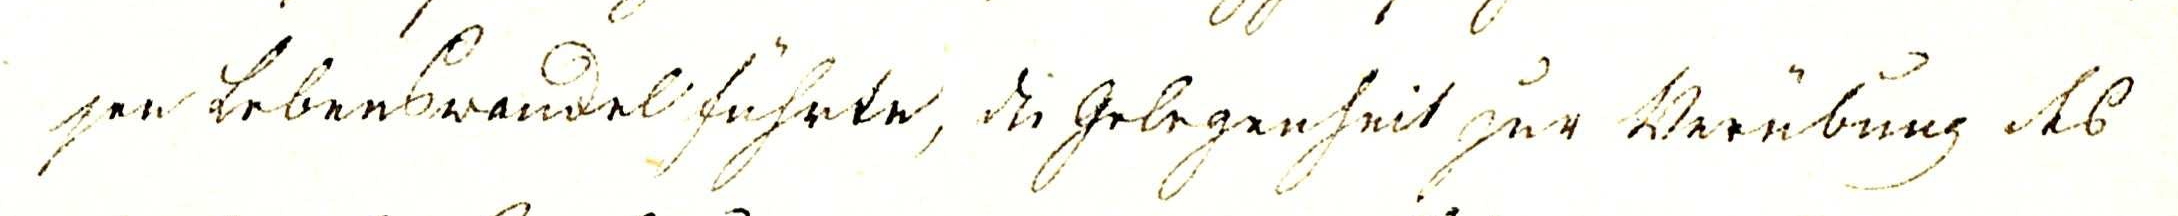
sen Lebenswandel führte, die Gelegenheit zur Verübung des
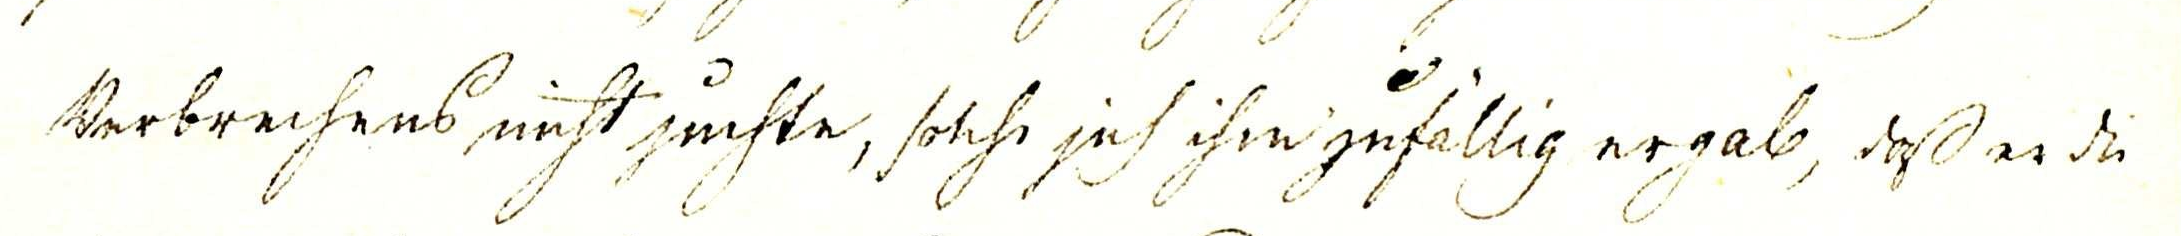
Verbrechens nicht suchte, solche sich ihm zufällig ergab, daß er die
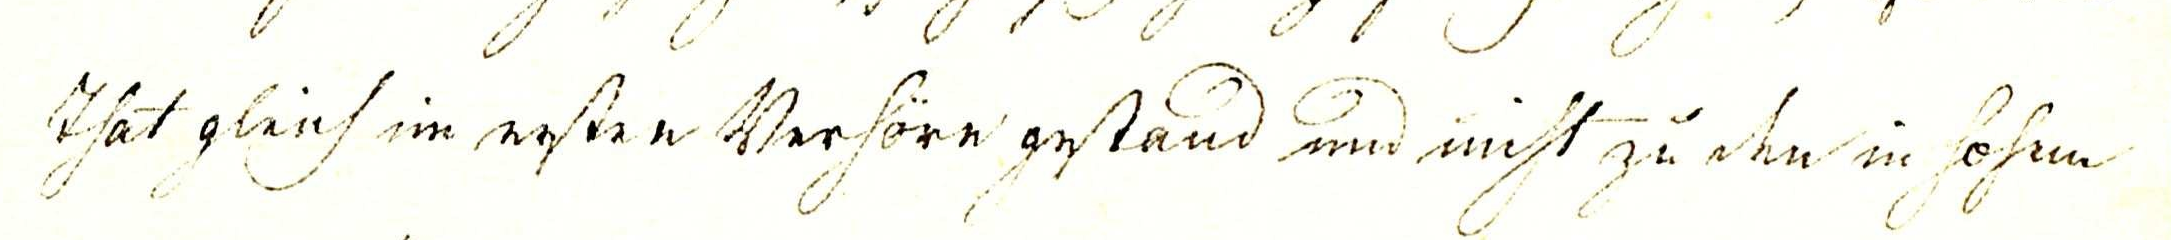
That gleich im ersten Verhöre gestand und nicht zu den in hohen
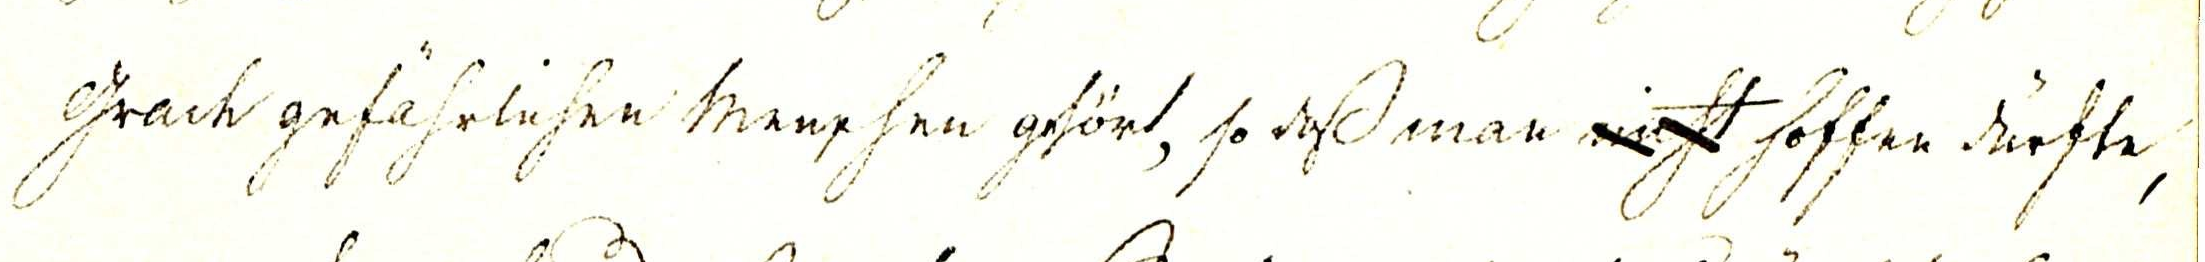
Grade gefährlichen Menschen gehört, so daß man nicht hoffen dürfte,
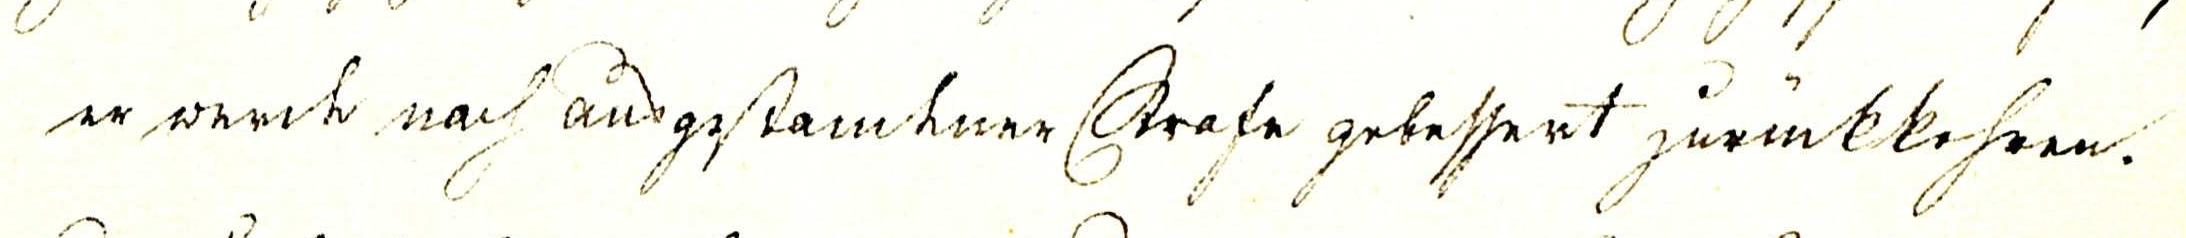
er werde nach ausgestandener Strafe gebessert zurückkehren.
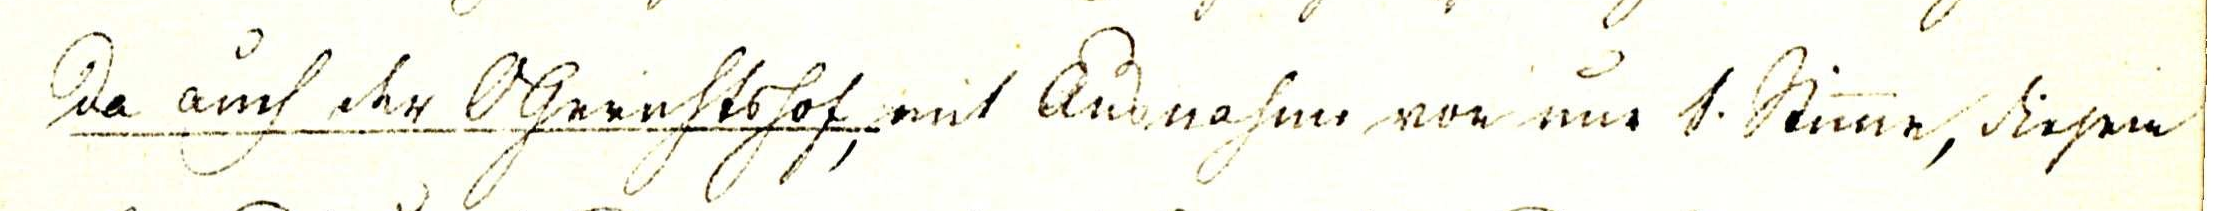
Da auch der O.Gerichtshof, mit Ausnahme von nur 1. Stimme, diesen
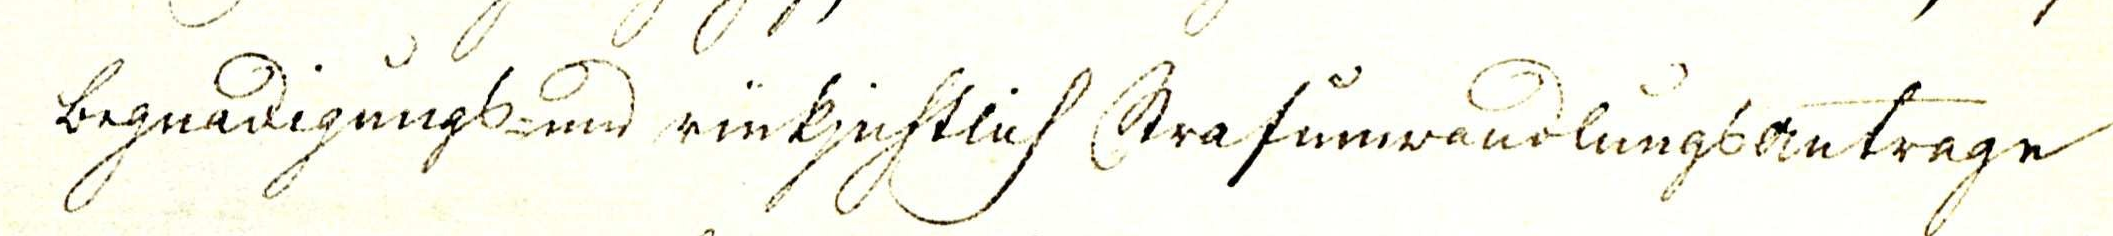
Begnadigungs- und rücksichtlich Strafumwandlungsantrage
